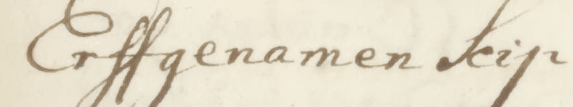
Erffgenamen kip.
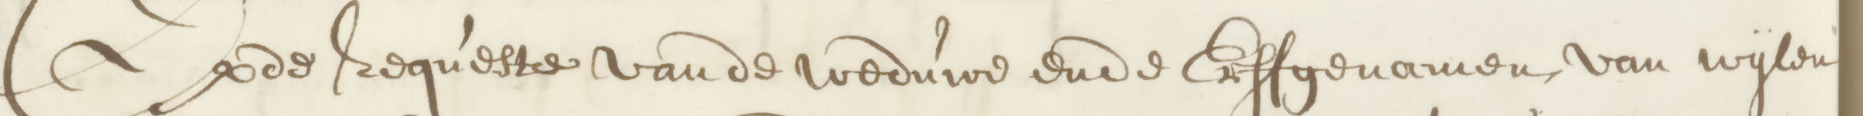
Opde Requeste van de weduwe ende Erffgenamen van wijlen
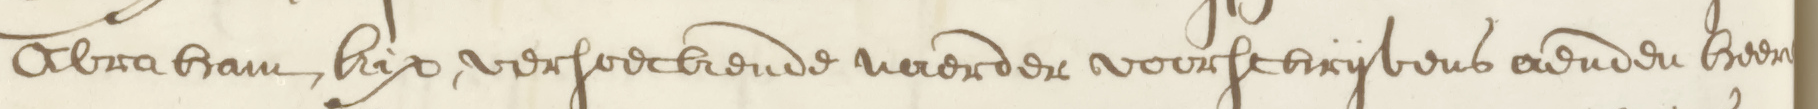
Abraham kip, versoeckende naerder voorschrijvens aenden heer
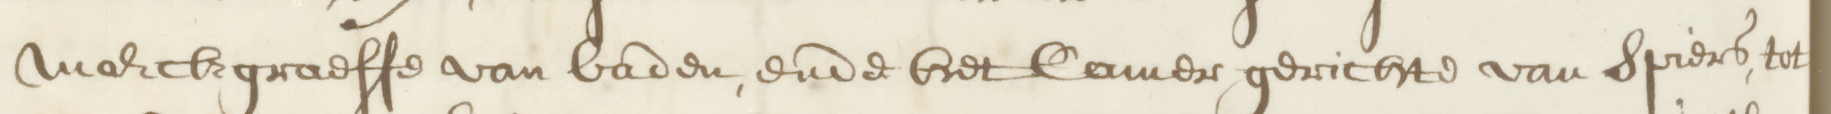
Marckgraeffe van baden, ende het Camer gerichte van Spiers, tot
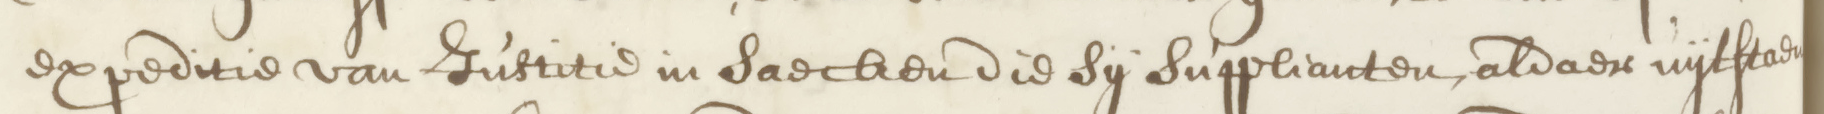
expeditie van Justitie in Saecken die sij Supplianten, aldaer uijtstaen
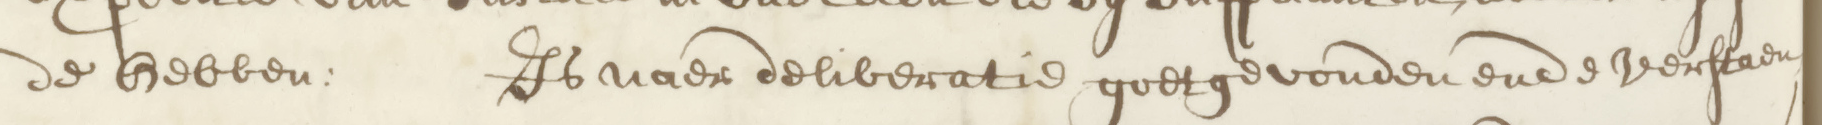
de hebben: Is naer deliberatie goetgevonden ende verstaen
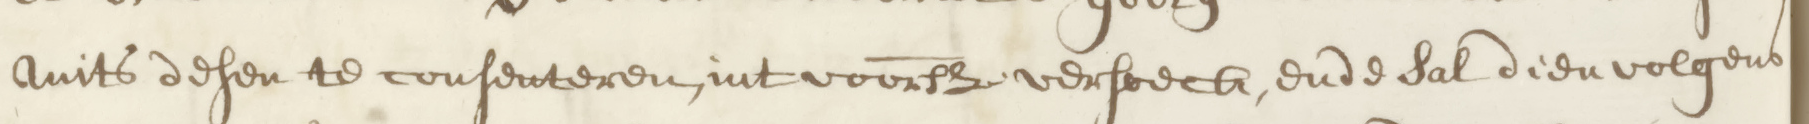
mits desen te consenteren, int voorsr. versoeck, ende sal dienvolgens
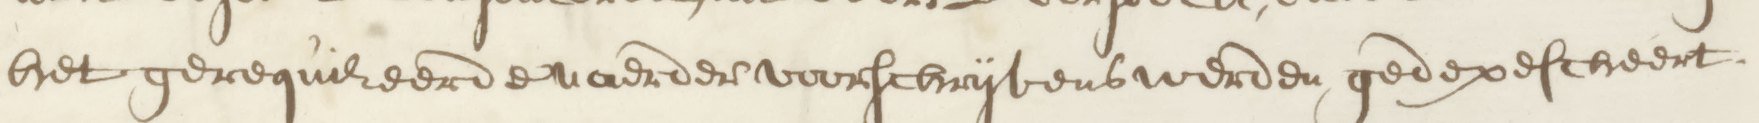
het gerequireerde naerder voorschrijvens werden gedepescheert.
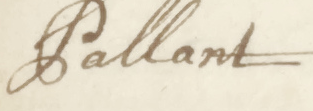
Pallant
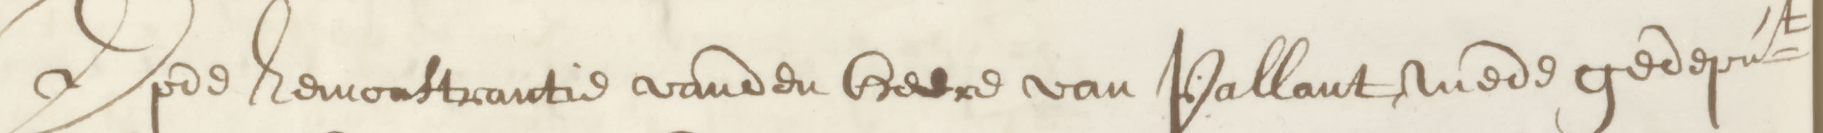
Opde Remonstrantie vanden Heere van Pallant mede gedeput
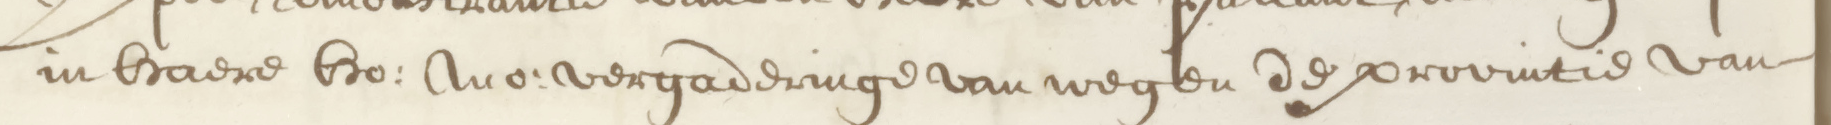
in haere Ho:Mo: vergaderinge van wegen de provintie van
